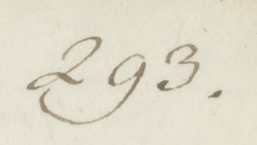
293.
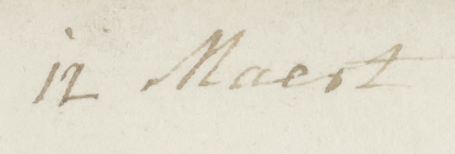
12 Maert
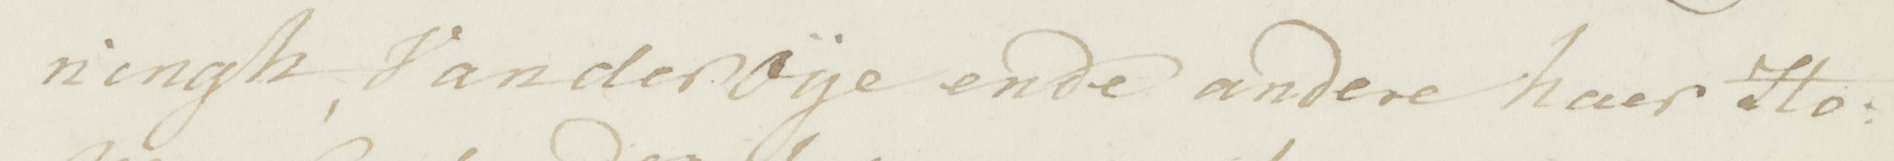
ningh, Vander Oije ende andere haer Ho:
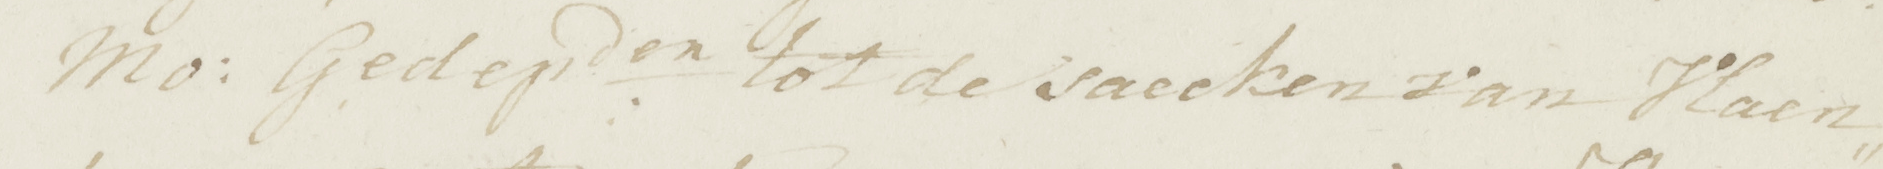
Mo: Gedepden. tot de saecken van Vlaen„
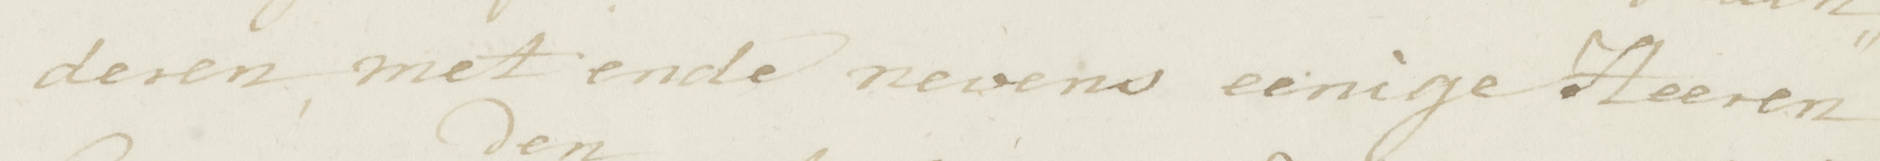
deren, met ende nevens eenige Heeren
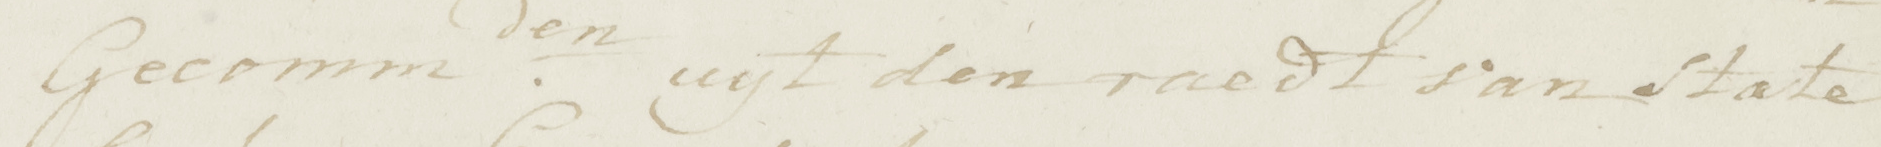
Gecommden. uyt den raedt van State
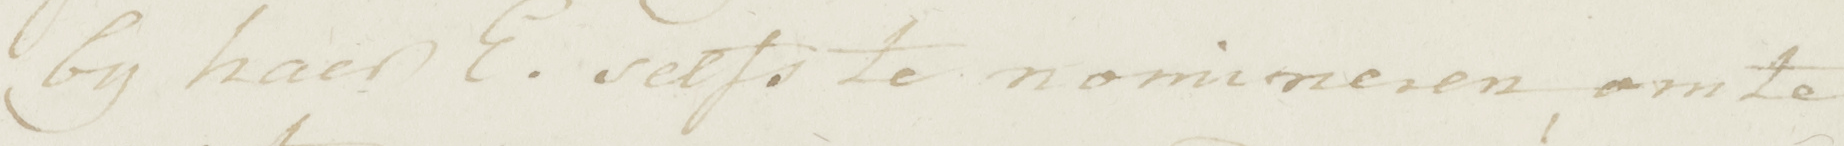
bij haer E. selfs te nomineren, om te
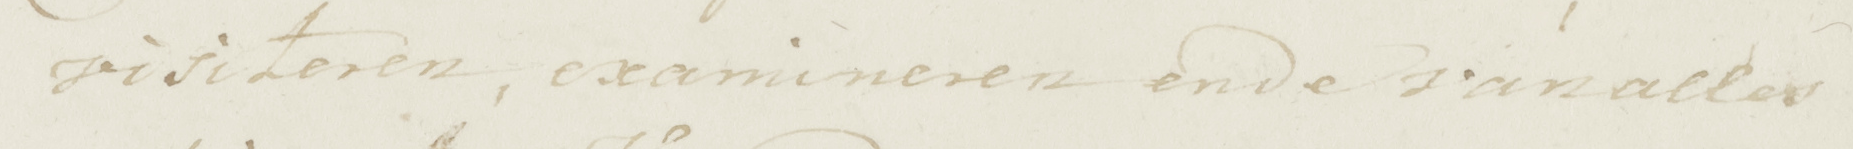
visiteren, examineren ende van alles
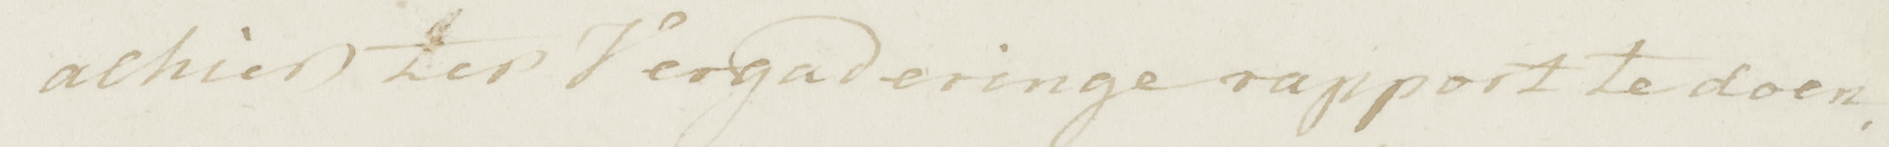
alhier ter Vergaderinge rapport te doen.
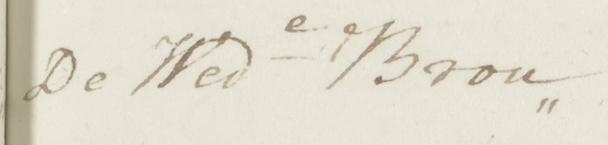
De Wede Brou„
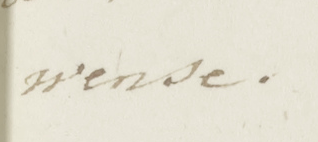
wense.
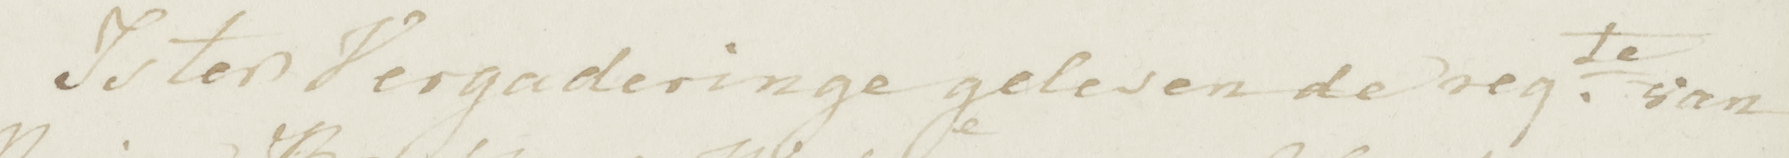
Is ter Vergaderinge gelesen de reqte. van
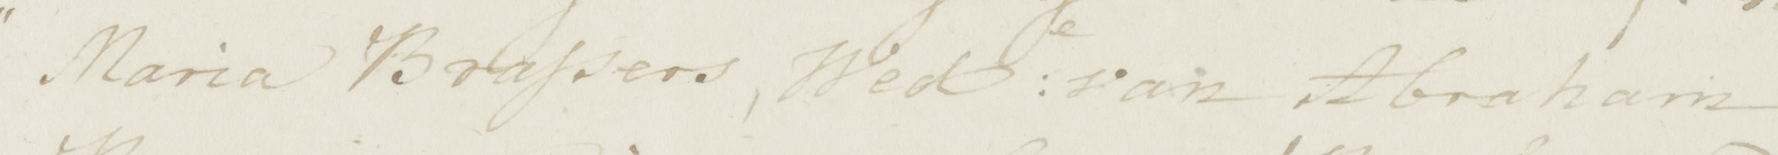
Maria Brassers, Wede: van Abraham
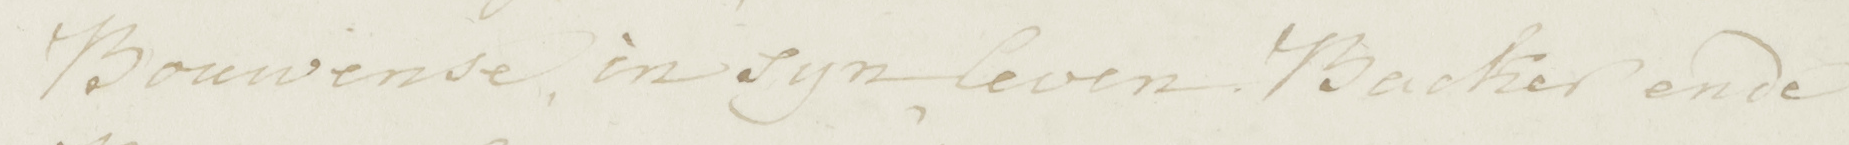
Bouwense, in syn leven Backer ende
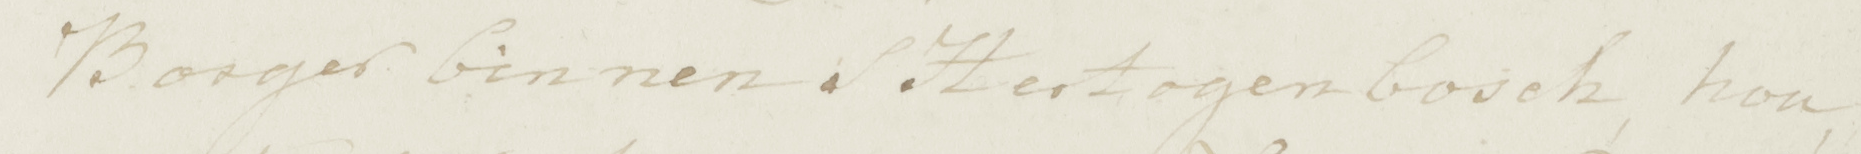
Borger binnen s'Hertogenbosch hou„
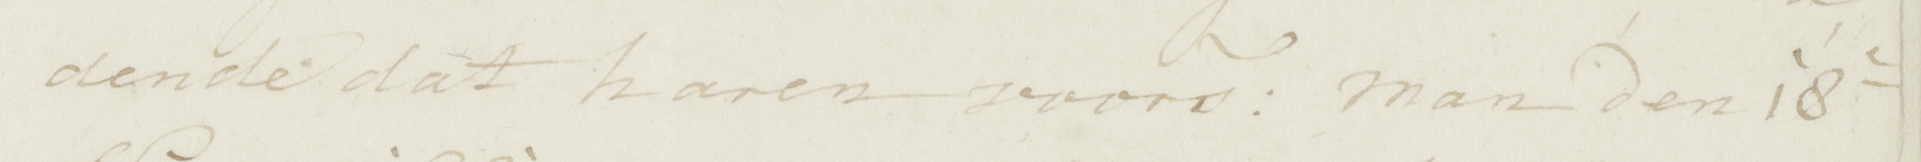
dende dat haren voors: man 18e
